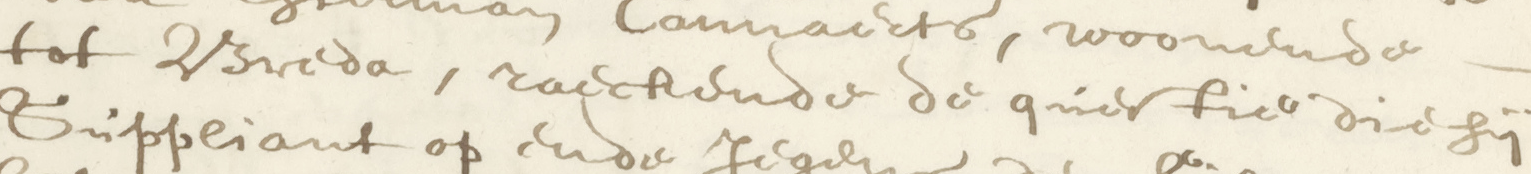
tot Breda, raeckende de questie die hij
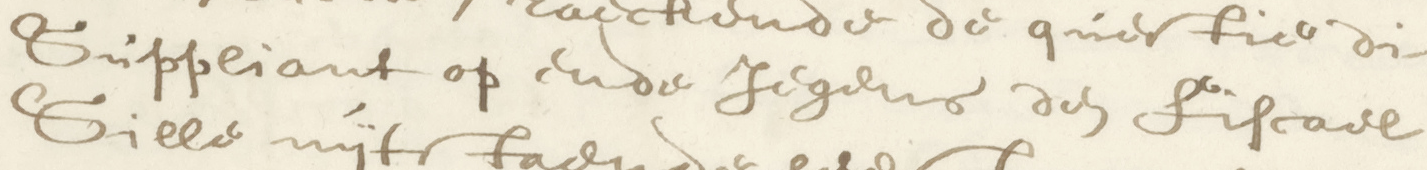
Suppliant op ende Jegens den Fiscael
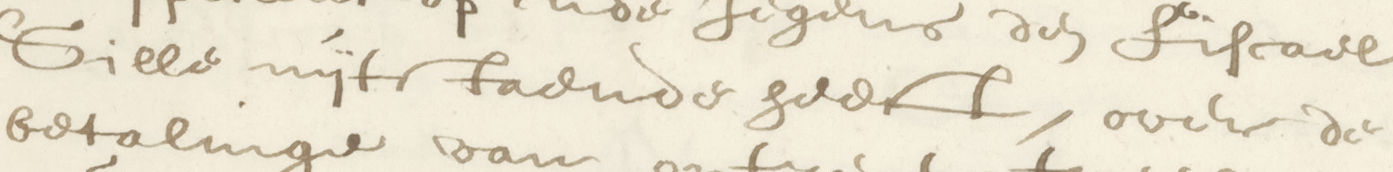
Sille uijtstaende heeft, over de
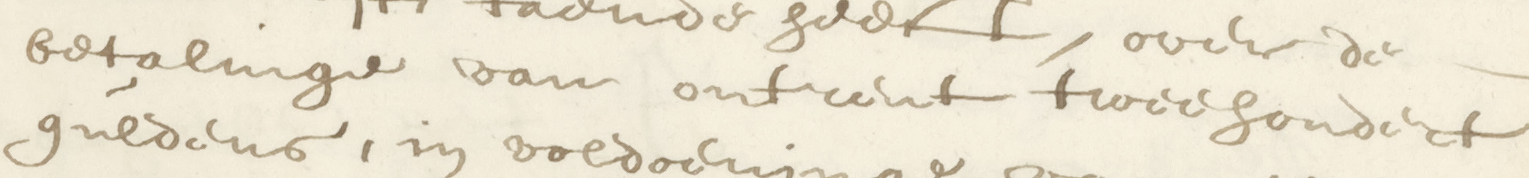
betalinge van ontrent tweehondert
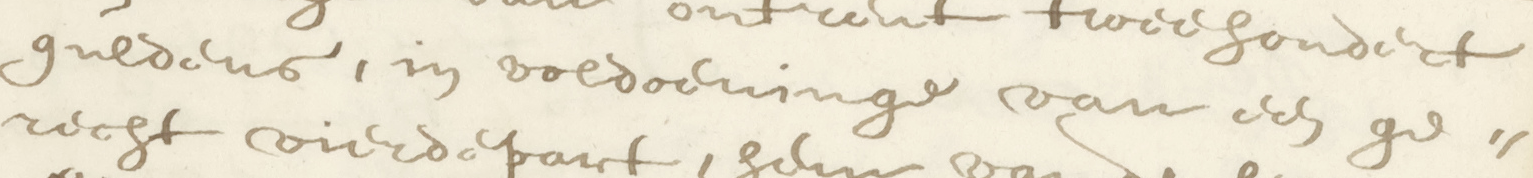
guldens, in voldoeninge van een ge„
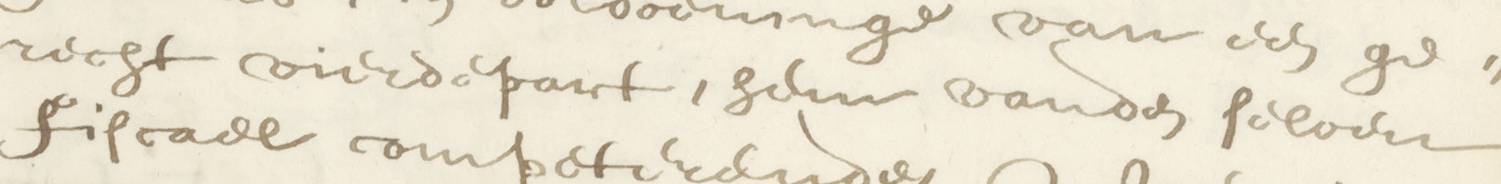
recht vierdepart, hem vanden selven
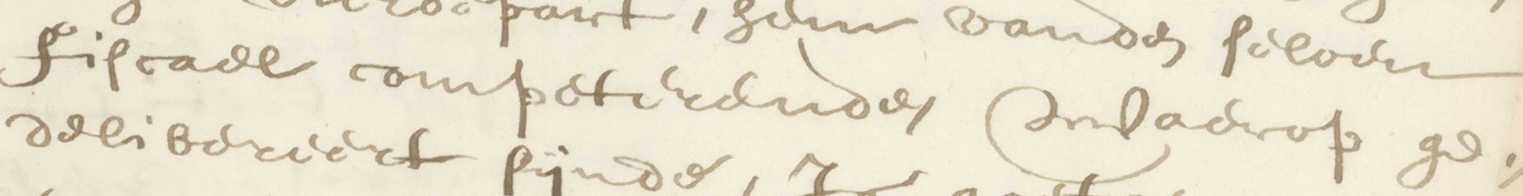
Fiscael competerende. Waerop ge,,
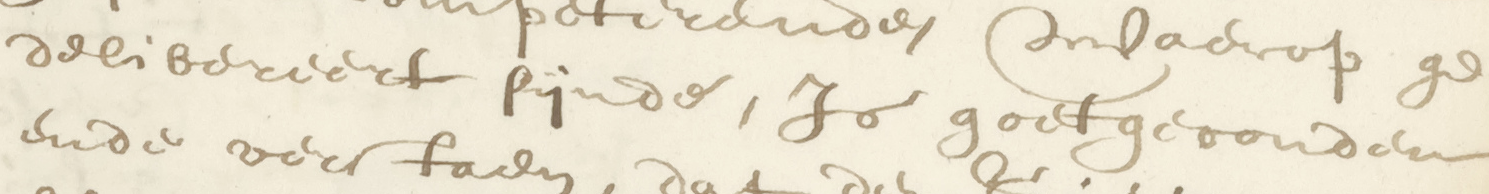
delibereert sijnde, Is goetgevonden
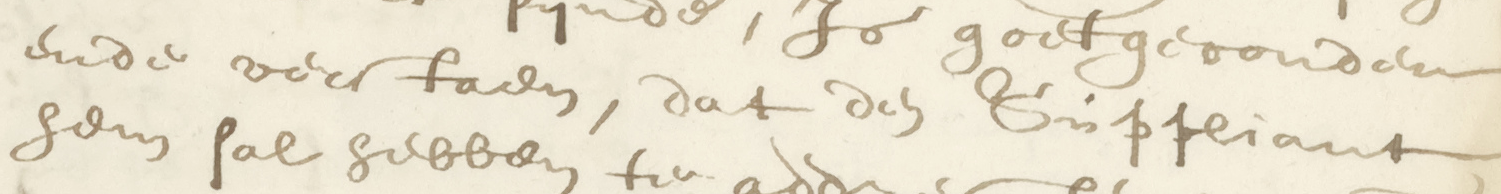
ende verstaen, dat den Suppliant
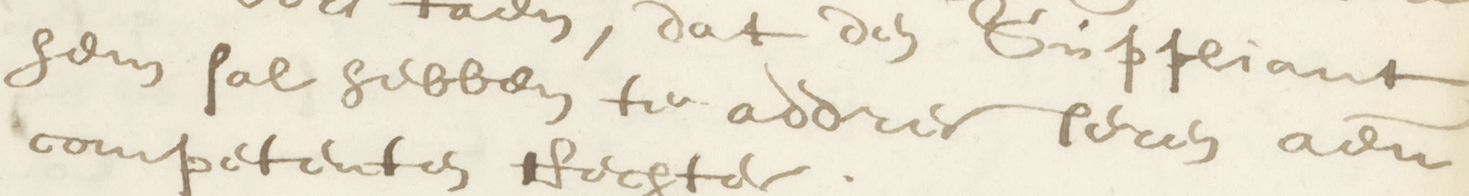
hem sal hebben te addresseren aen
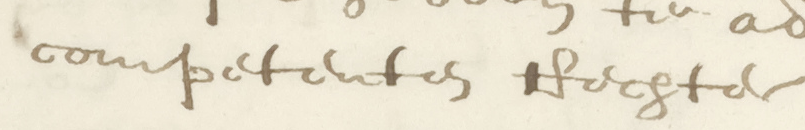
competenten Rechter.
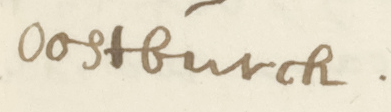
Oostburch.
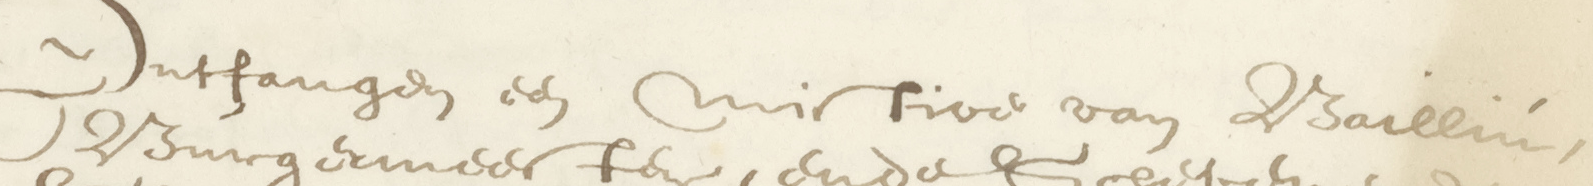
Ontfangen een Missive van Bailliu,
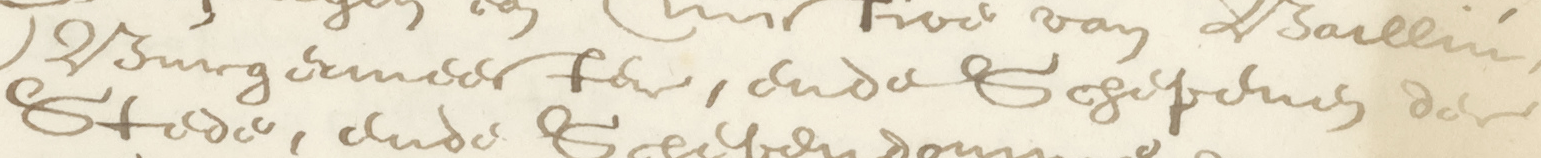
Burgermeester, ende Schepenen, der
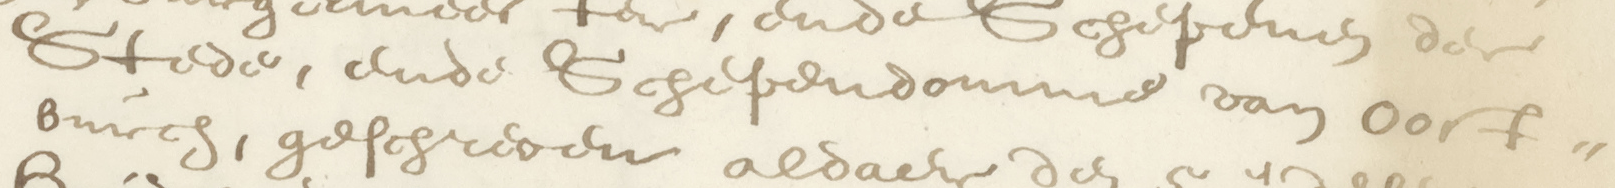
Stede, ende Schependomme van Oost,,
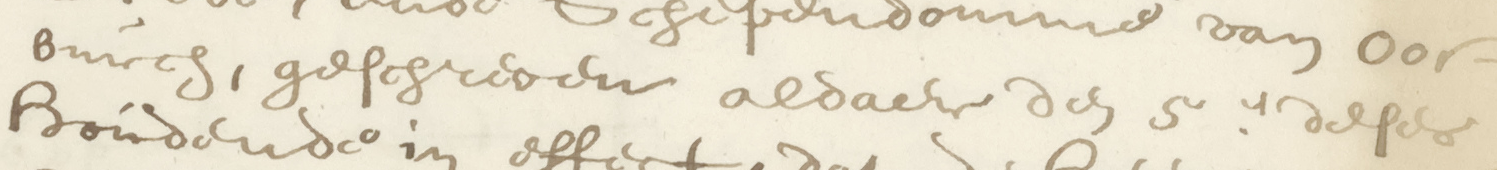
burch, geschreven aldaer den 5en. deses,
